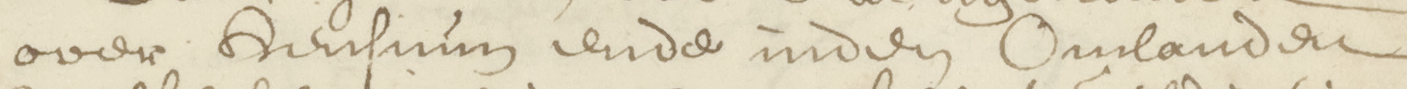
over Hensium ende inden Omlanden
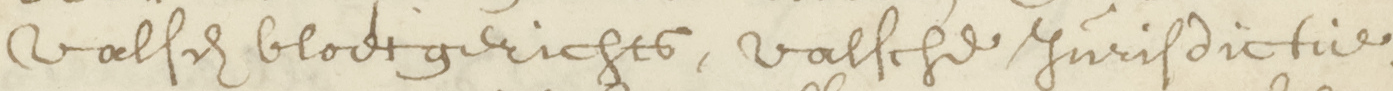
valsch bloetgerichts, valsche Jurisdictie
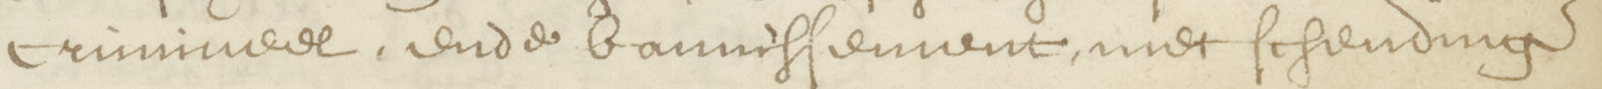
crimineel, ende bannissement, met schendinge
